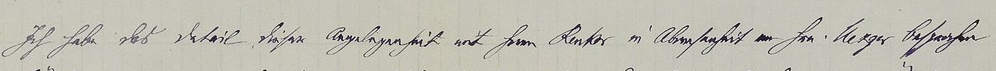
Ich habe das Detail dieser Angelegenheit mit Herrn Renker in Abwesenheit von Hrn. Mezger besprochen
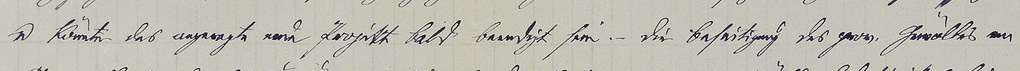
& könnte das angeregte neue Projekt bald beendigt sein. – Die Beseitigung des prov. Gewölbes von
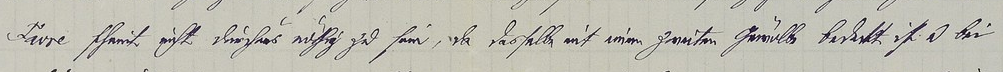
Favre scheint nicht durchaus nöthig zu sein, da dasselbe mit einem zweiten Gewölbe bedekt ist & bei
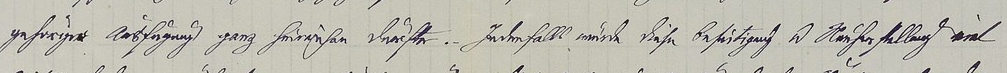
gehöriger Ausfugung ganz hinreichen dürfte. – Jedenfalls würde diese Beseitigung & Neuherstellung viel
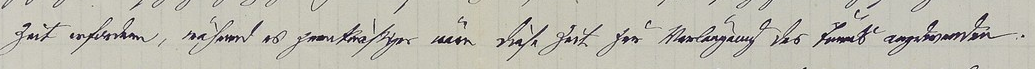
Zeit erfordern, während es zweckmäßiger wäre diese Zeit zur Verlängerung des Tunnels anzuwenden.
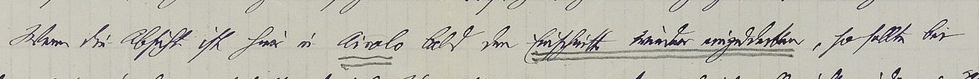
Wenn die Absicht ist hier in Airolo bald den Einschnitt wieder einzudecken , so sollte bei
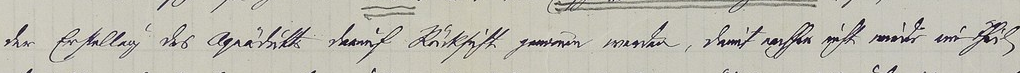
der Erstellung des Aquädukts darauf Rücksicht genommen werden, damit nachher nicht wieder ein Theil
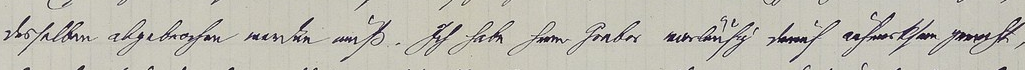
desselben abgebrochen werden muß. Ich habe Herrn Gruber vorläufig darauf aufmerksam gemacht,
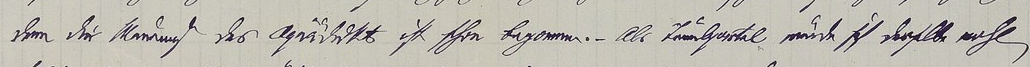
denn die Maurung des Aquädukts ist schon begonnen. – Als Tunnelportal würde sich derselbe wohl
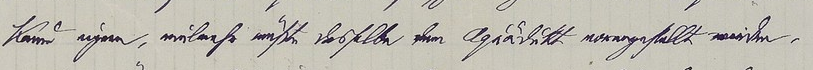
kaum eignen, vielmehr müßte dasselbe dem Aquädukt vorangestellt werden.
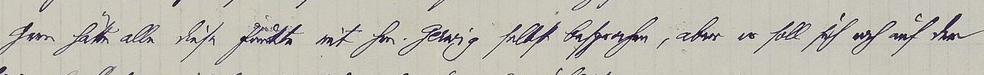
Gern hätte alle diese Punkte mit Hrn. Gerwig selbst besprochen, aber er soll sich noch auf der
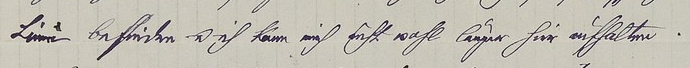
Linie befinden & ich kann mich nicht wohl länger hier aufhalten.
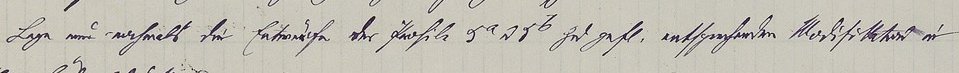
Lege nur nochmals die Entwürfe der Profile 9a & 9b zu gefl. entsprechender Modifikation in
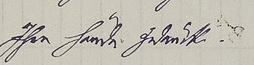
Ihre Hände zurück.
